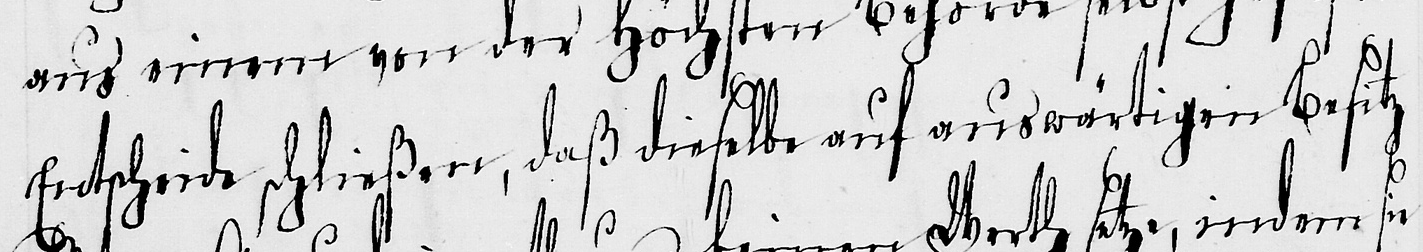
Entscheide schließen, daß dieselbe auf auswärtigen Besitz
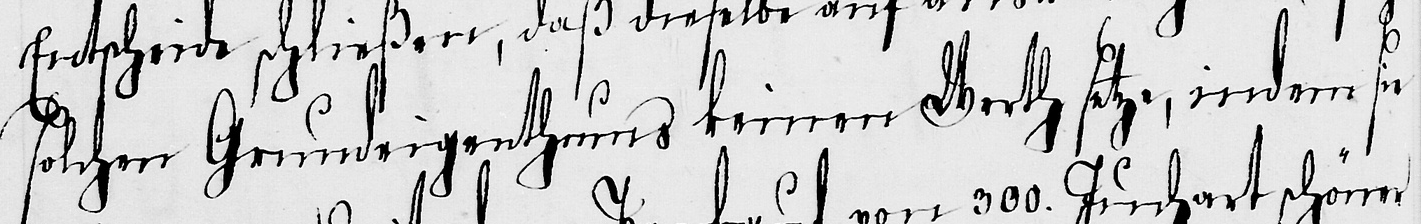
solchen Grundeigenthums keinen Werth setze, indem
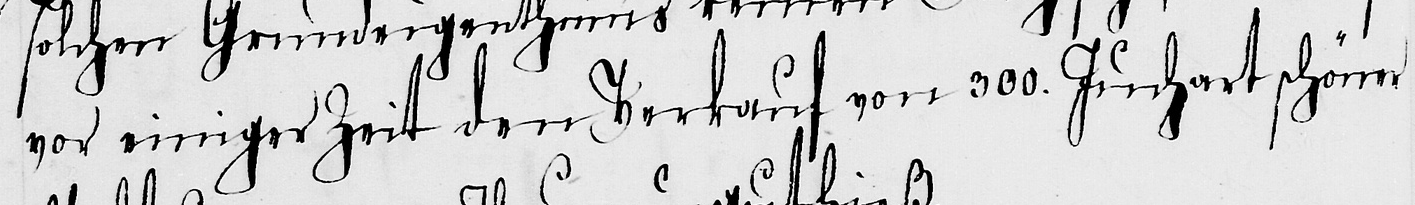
vor einiger Zeit den Verkauf von 300. Juchart schöner
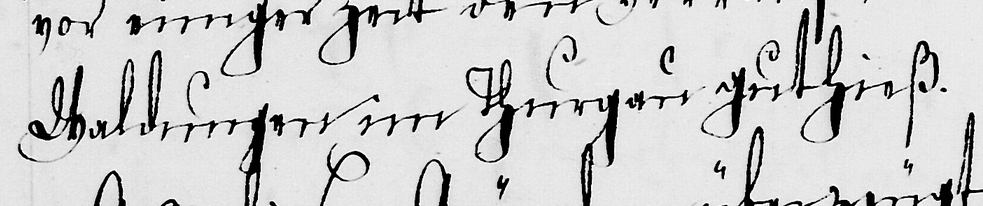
Waldungen im Thurgau guthieß.
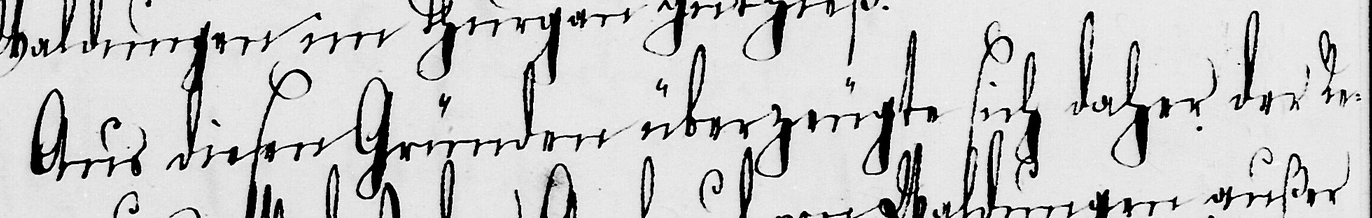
Aus diesen Gründen überzeugte sich daher der R¬
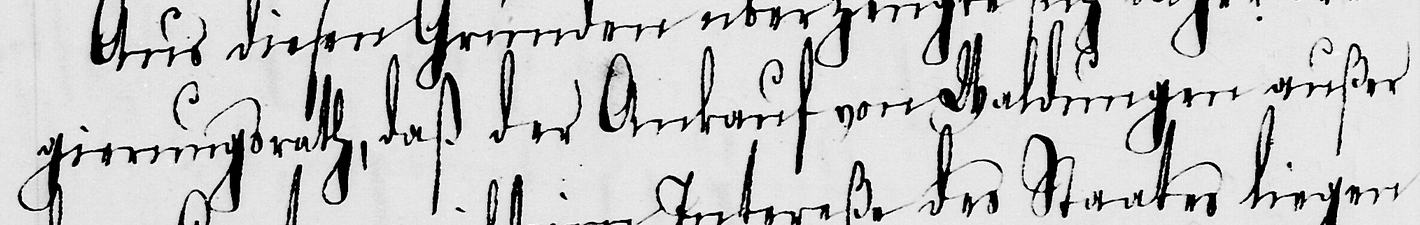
egierungsrath, daß der Ankauf von Waldungen außer
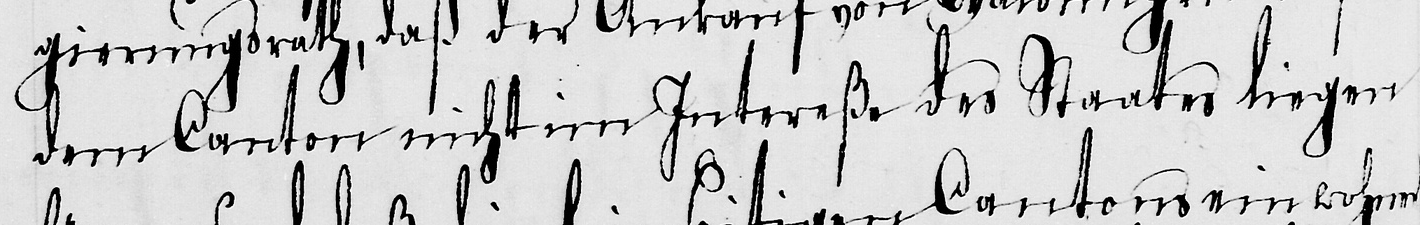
dem Canton nicht im Intereße des Staates liegen
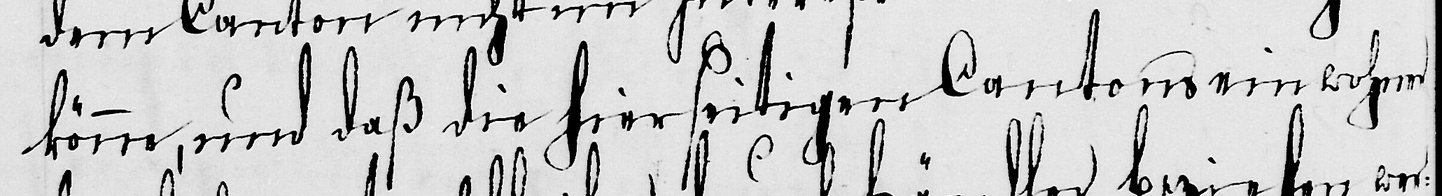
könne, und daß die hierseitigen Cantonseinwohner
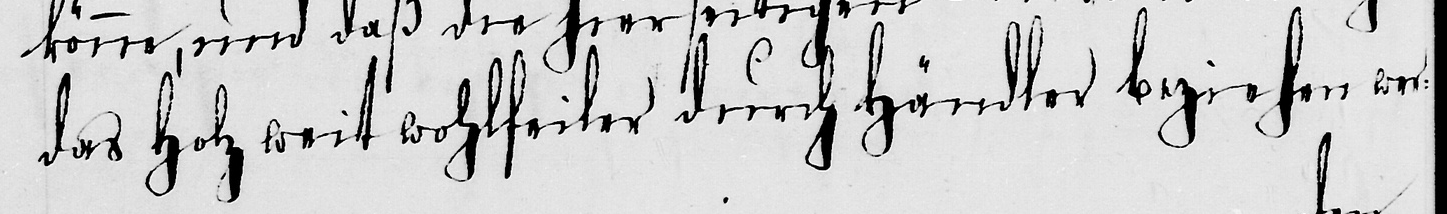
das Holz weit wohlfeiler durch Händler beziehen
